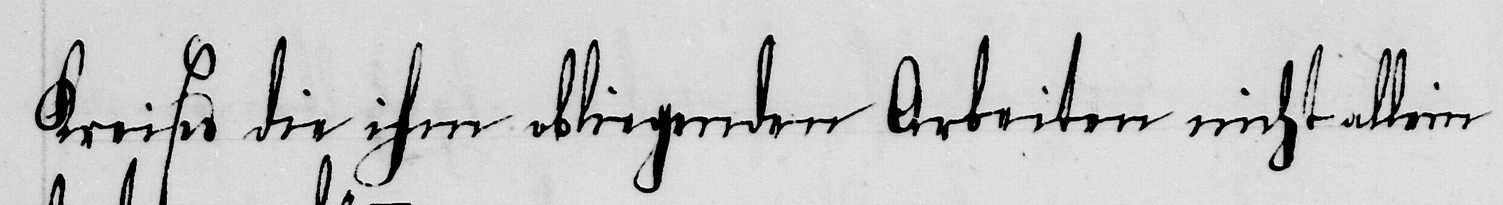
Kreises die ihm obliegenden Arbeiten nicht allein
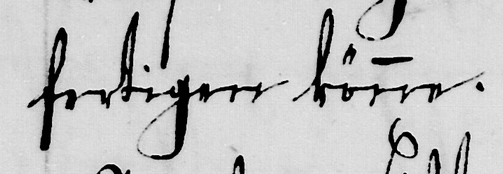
fertigen könne.
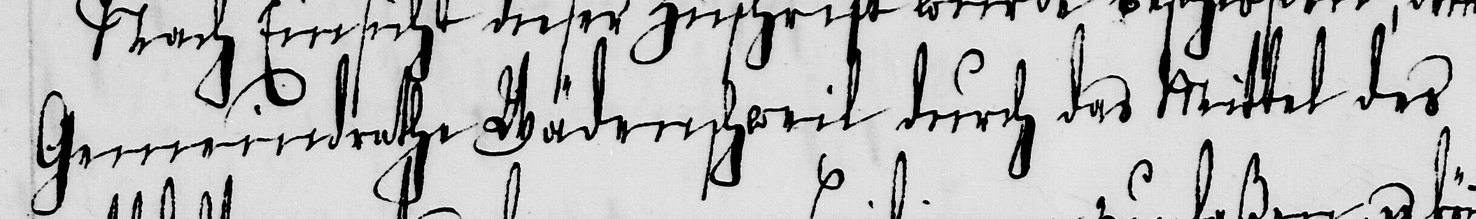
Gemeindrathe Wädenschweil durch das Mittel des
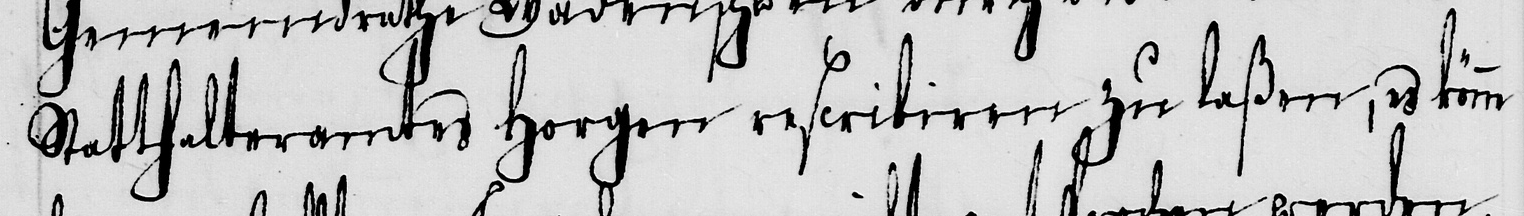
Statthalteramtes Horgen rescribiren zu laßen, es kön¬
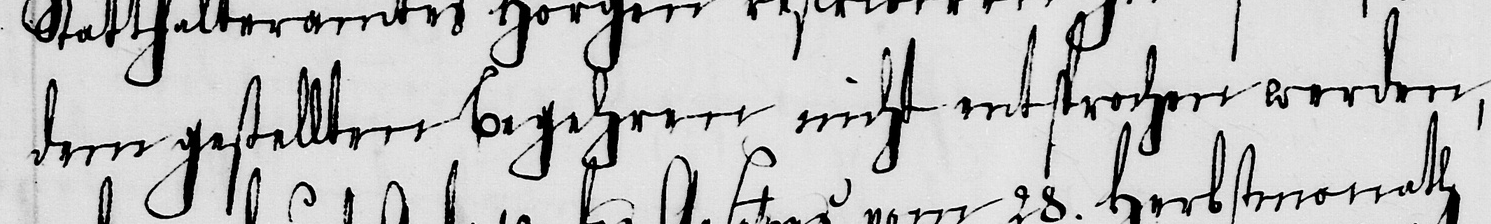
dem gestellten Begehren nicht entsprochen werden,
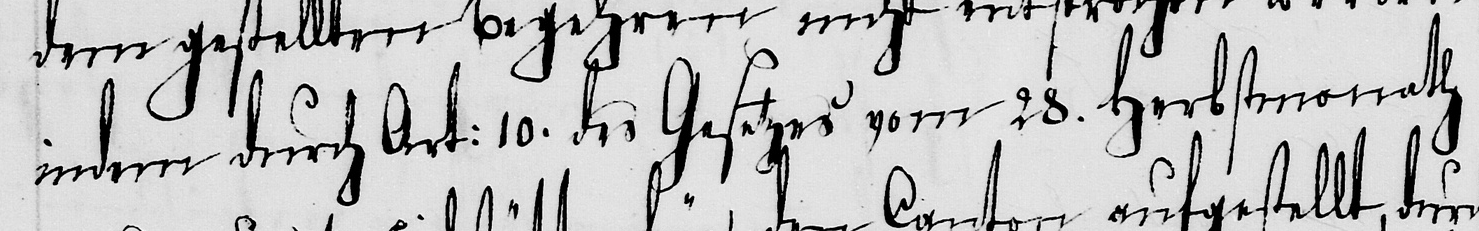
indem durch Art: 10. des Gesetzes vom 28. Herbstmonath
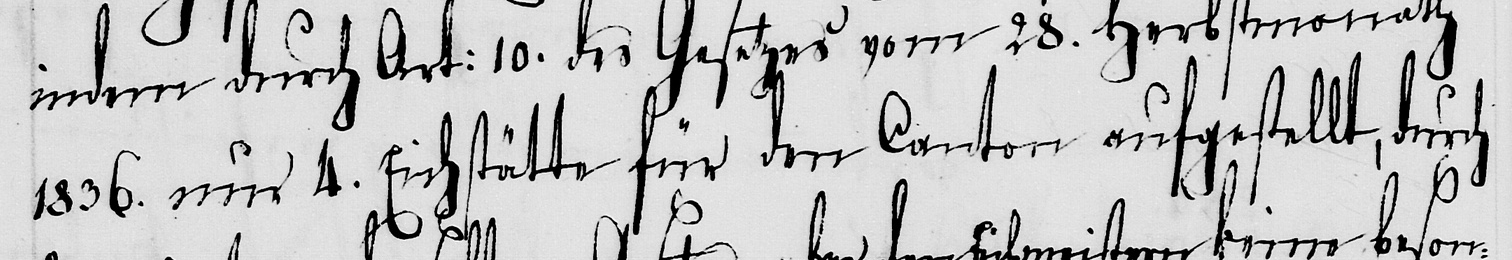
1836. nur 4. Eichstätte für den Canton aufgestellt, dur¬
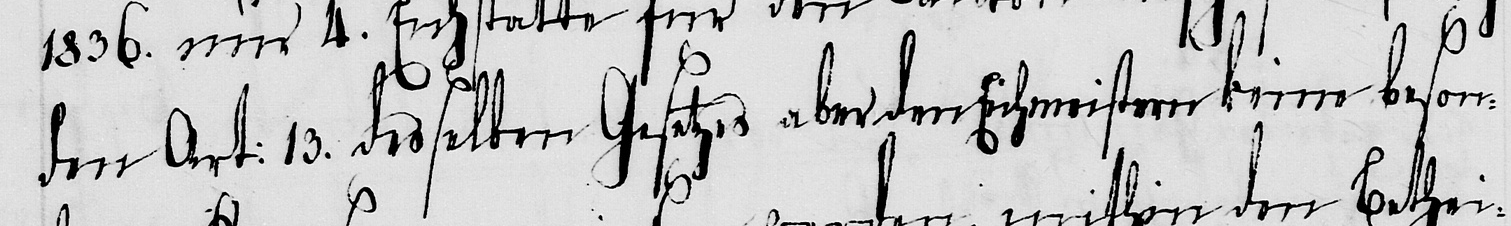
den Art: 13. desselben Gesetzes aber den Eichmeistern keine beson¬
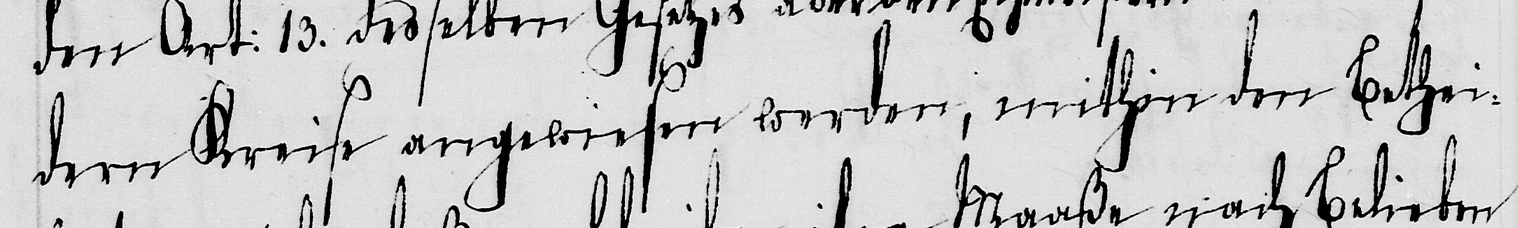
dern Kreise angewiesen werden, mithin den Bethei¬
